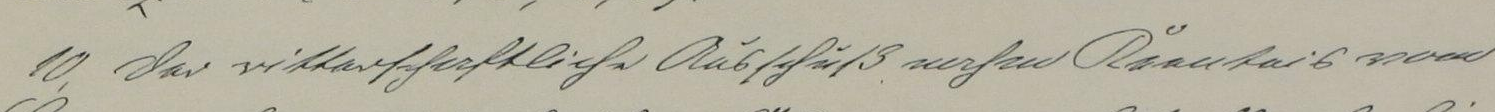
10. Der ritterschaftliche Ausschuß nahm Kenntnis vom
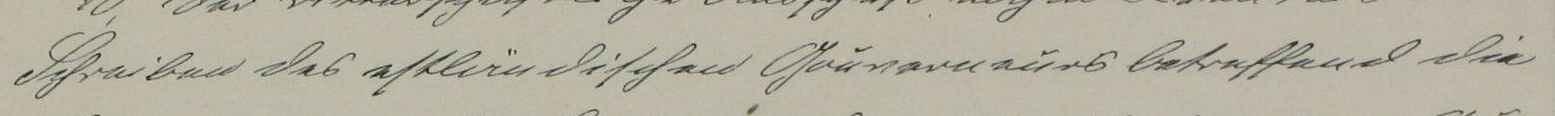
Schreiben des estländischen Gouverneurs betreffend die
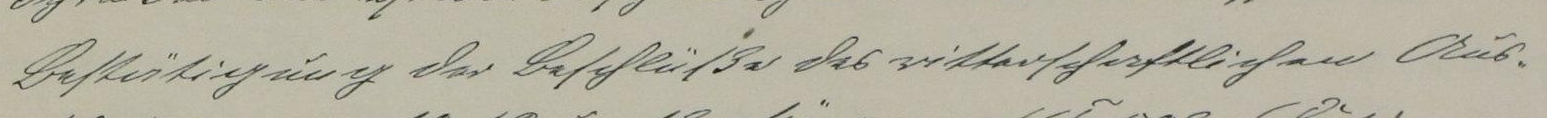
Bestätigung der Beschlüße des ritterschaftlichen Aus-
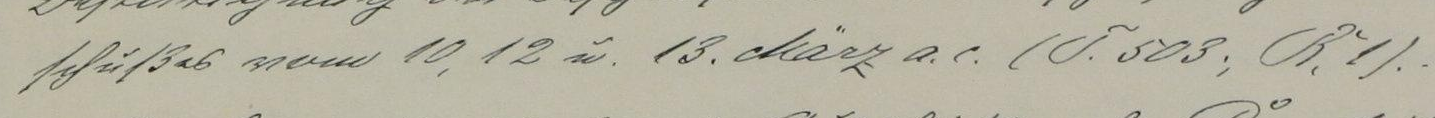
schußes vom 10, 12. und 13. März a.c. (T. 503; R.1).
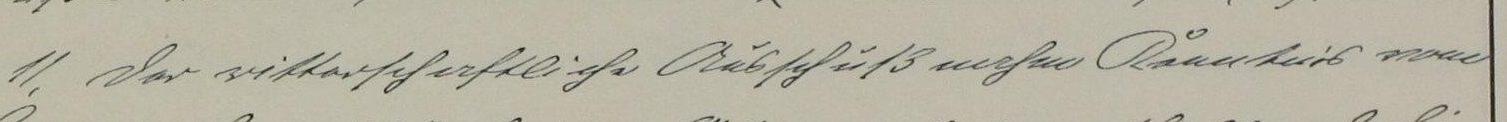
11. Der ritterschaftliche Ausschuß nahm Kenntnis vom
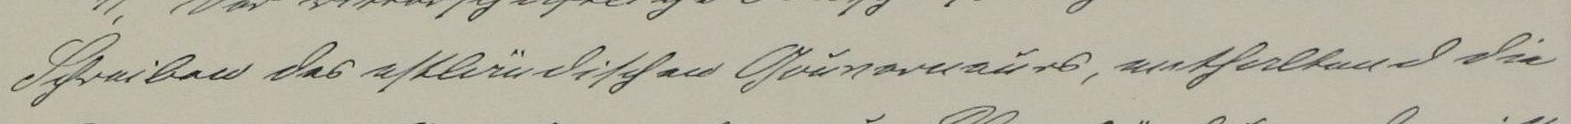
Schreiben des estländischen Gouverneurs, enthaltend die
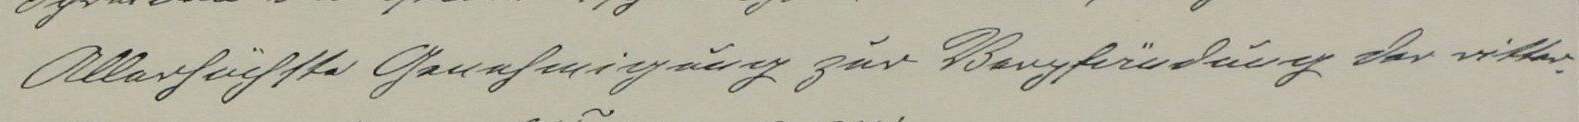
Allerhöchste Genehmigung zur Verpfändung der ritter-
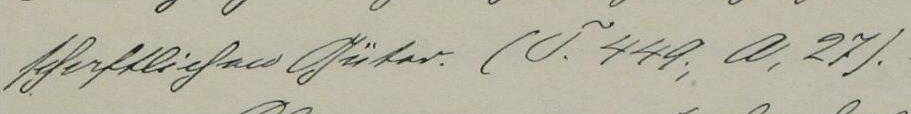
schaftlichen Güter (T.449; A.27).
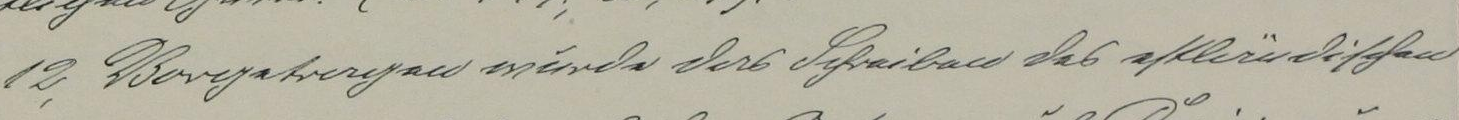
12. Vorgetragen wurde das Schreiben des estländischen
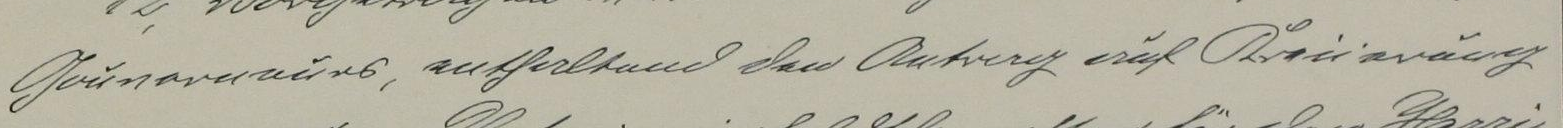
Gouverneurs, enthaltend den Antrag auf Kreiierung
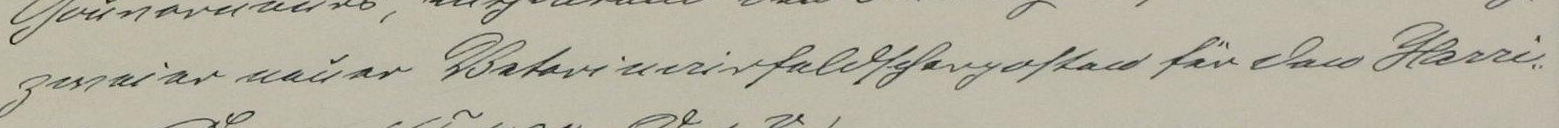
zweier neuer Veterinairfeldscherposten für den Harri-
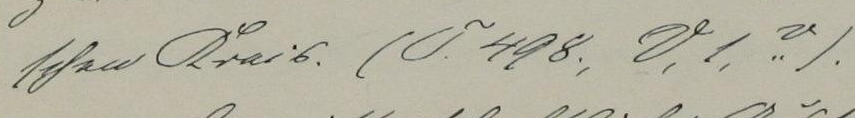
schen Kreis. (T.498; V.1v).
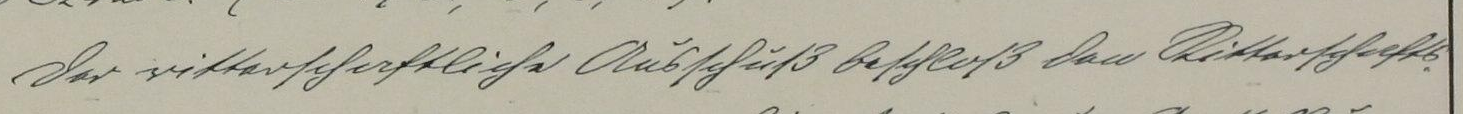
Der ritterschaftliche Ausschuß beschloß, den Ritterschafts-
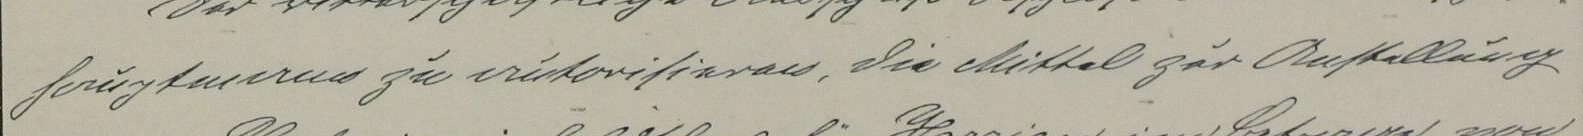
hauptmann zu autorisieren, die Mittel zur Anstellung
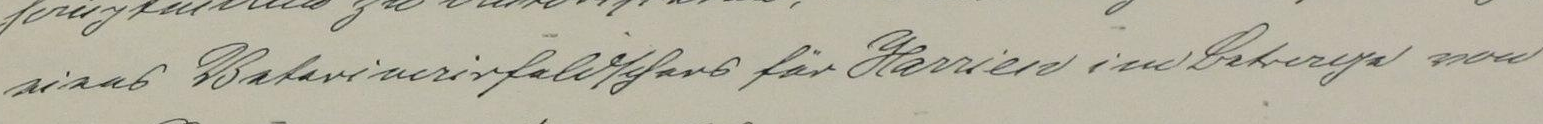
eines Veterinairfeldschers für Harrien im Betrage von
